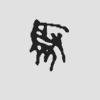聚
